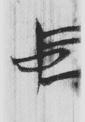𠁩
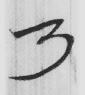乃
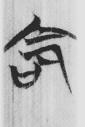命
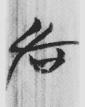左
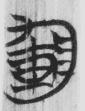軍
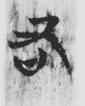右
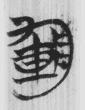軍
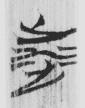涉
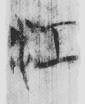江
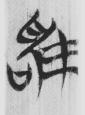鳴
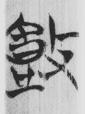鼓
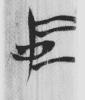𠁩
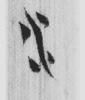水
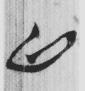㠯（以）
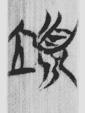{須立}
